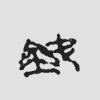欽
